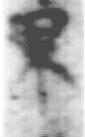果（戈）
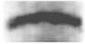一
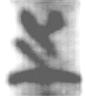之
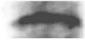一
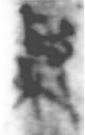杸
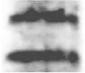二
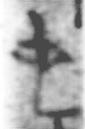屯
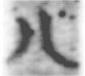八
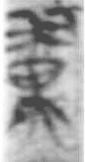翼
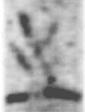之
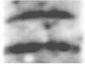二
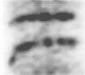二
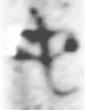屯
